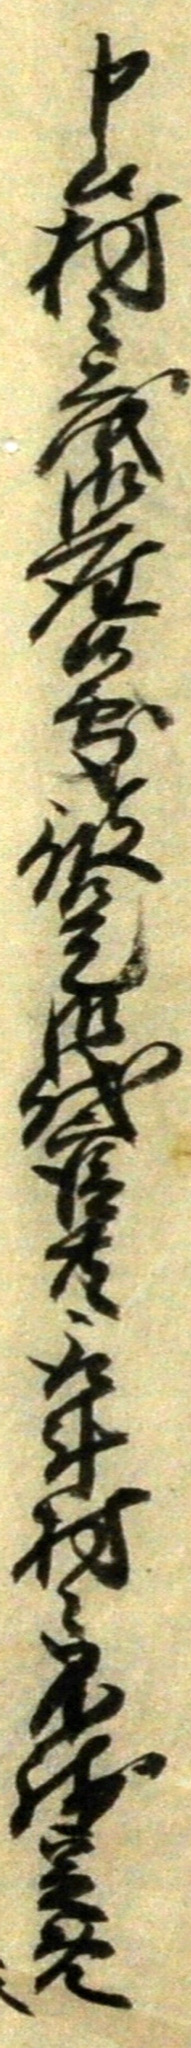申候村々茂御座候処彼是御代官共取斗村々不残定免之
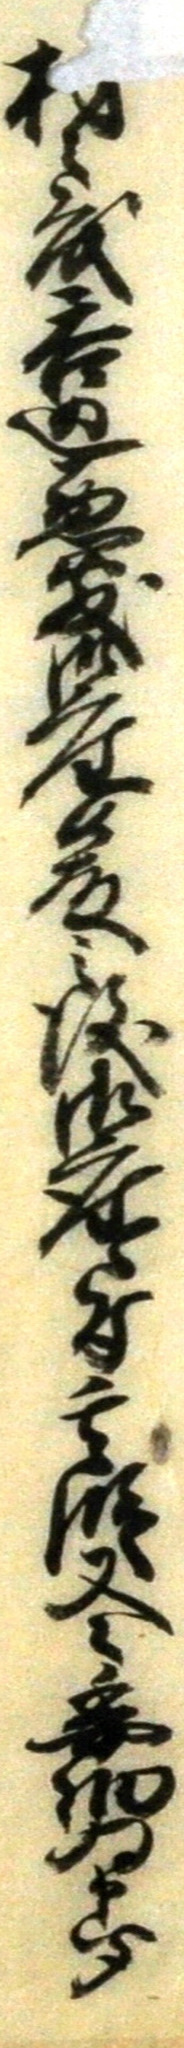村々茂呑込悪敷御座候故之儀御座候付其段又々委細為申聞
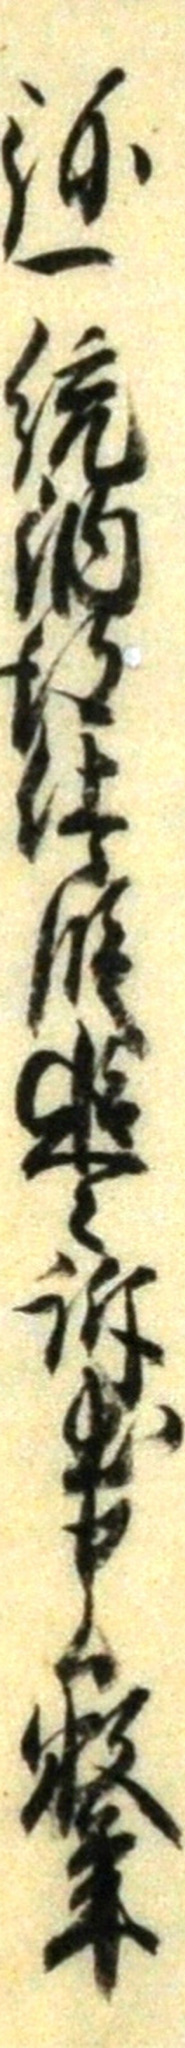弥一統納得仕候段追々訴出申候数年
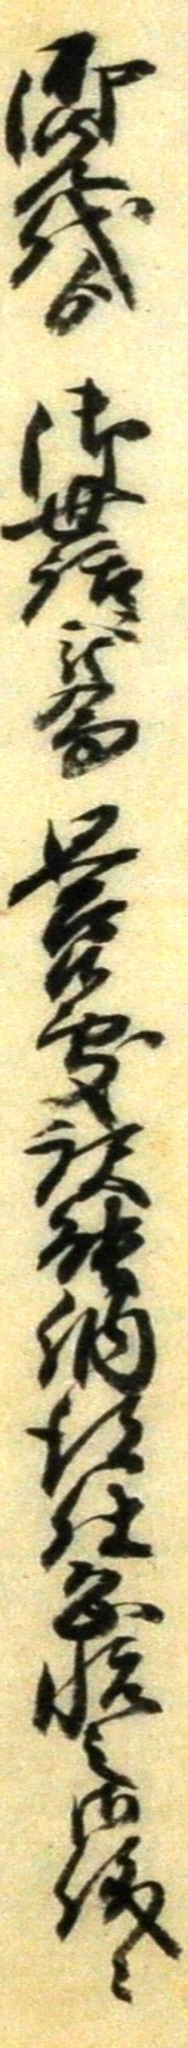御先代ゟ御世話ニ被為思召候処訳能納得仕恐悦之御儀ニ
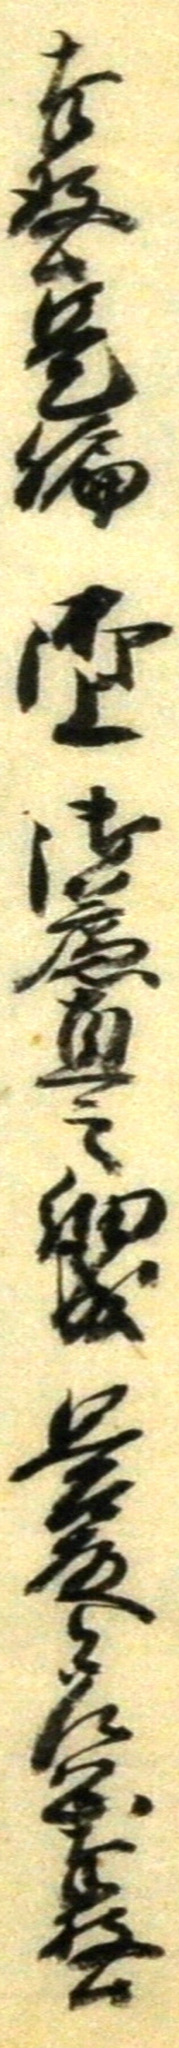奉存候之偏御上御廉直之細成思召故と乍恐奉存候
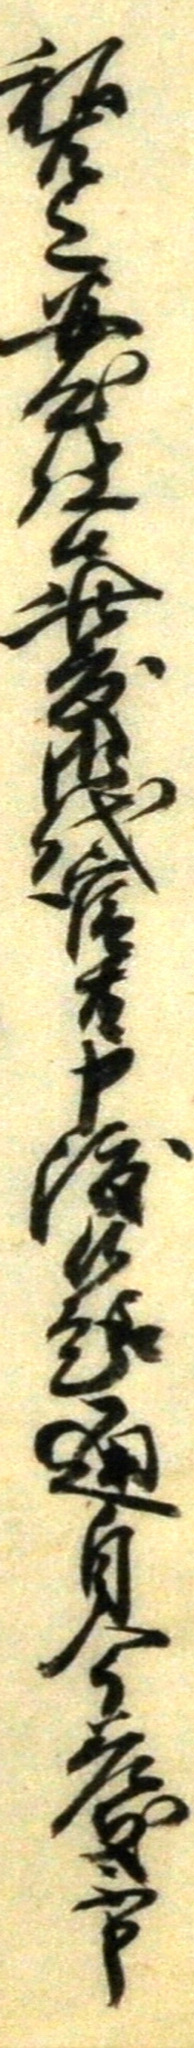私共迄安心仕候此度御代官共申渡候趣通自今差支不申
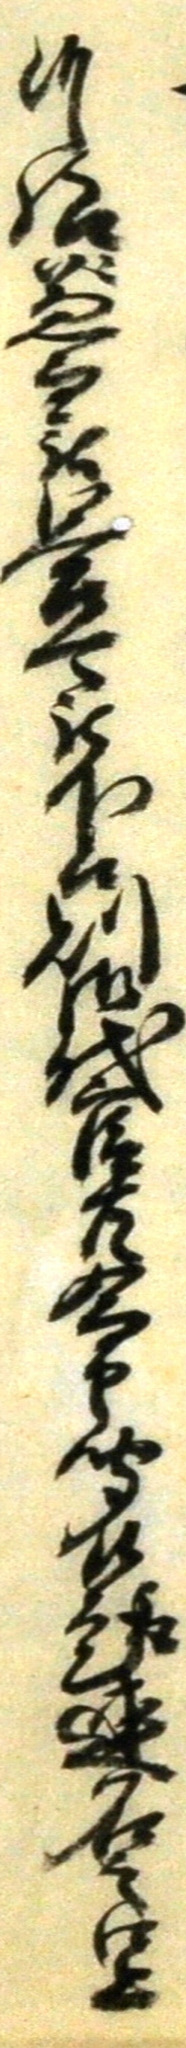候之様ニ兼而被思召可被下候則御代官共為申聞候趣連名之口上
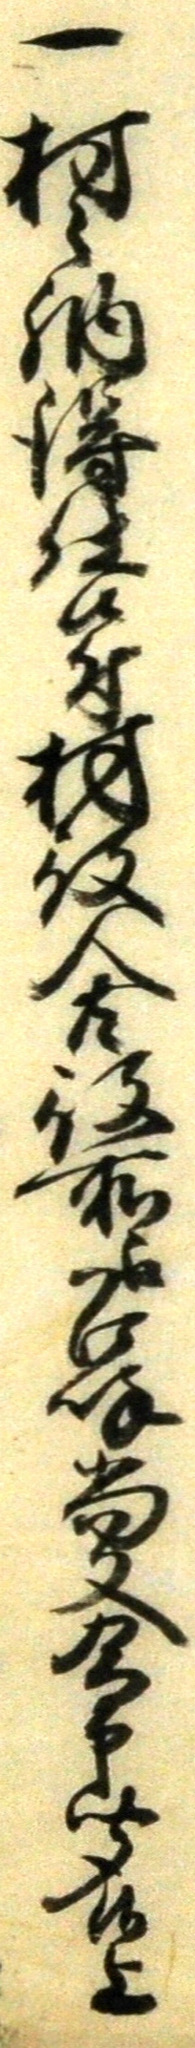一村々納得仕候付村役人共役所江召呼尚又為申聞候上
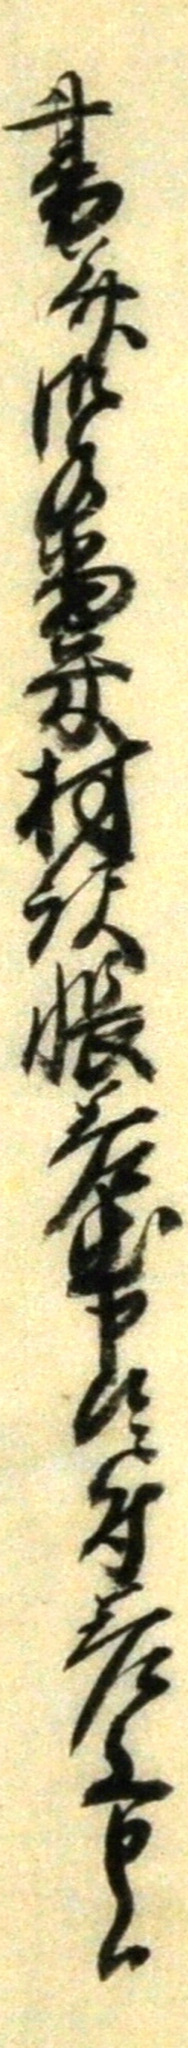書幷御手当米村訳帳差出申候ニ付差上申候
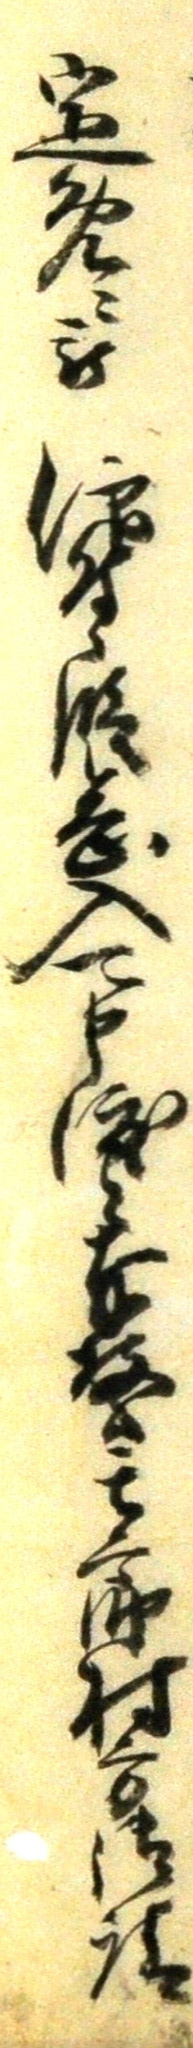定免ニ被仰付候段念入可申渡と奉存候其節村方御請

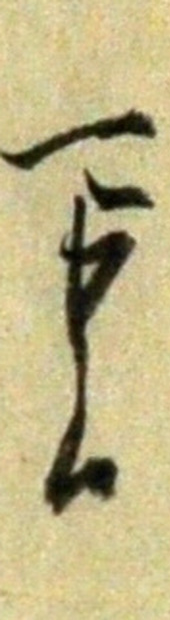可申候
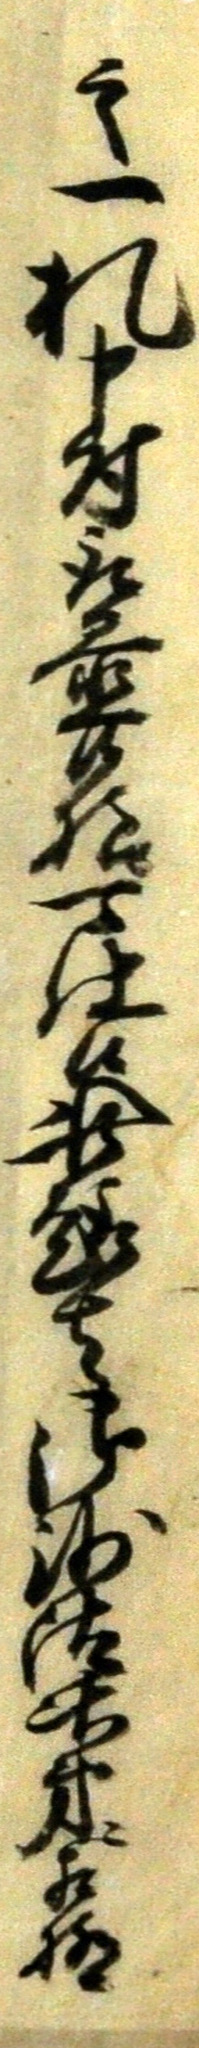之一札申付取置候様可仕候此趣者御沙汰次第ニ相極
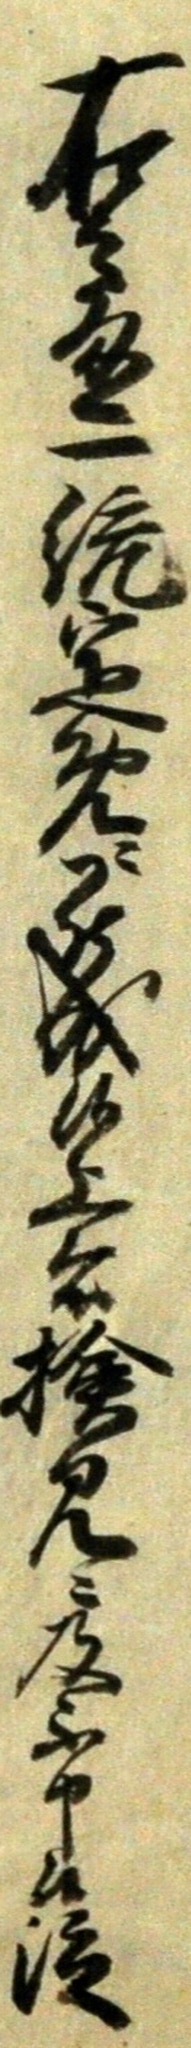右之通一統定免ニ罷成候上者検見ニ及不申候従
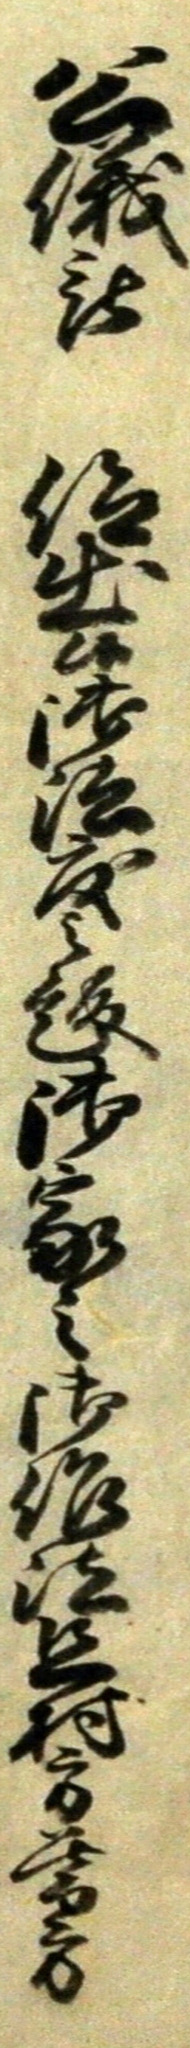公儀被仰出候御法度之趣御家之御作法且村方暮方
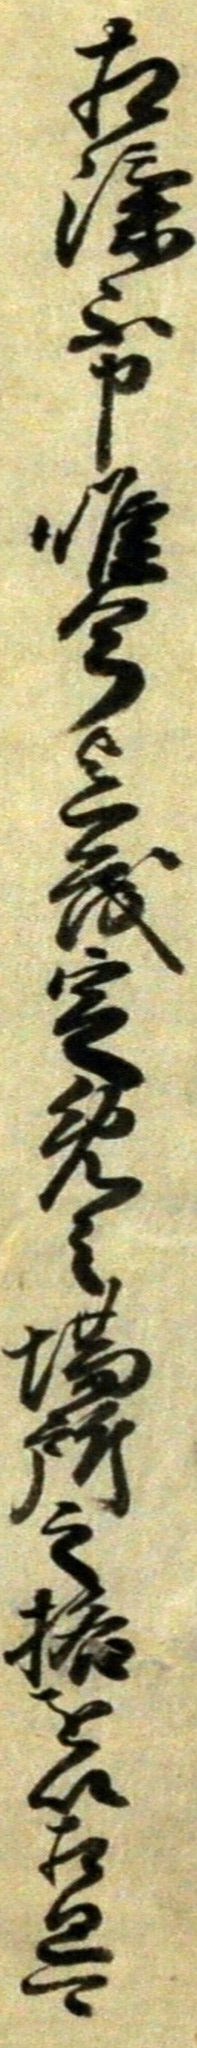相済不申唯今迄茂定免之場所之格を以相廻可
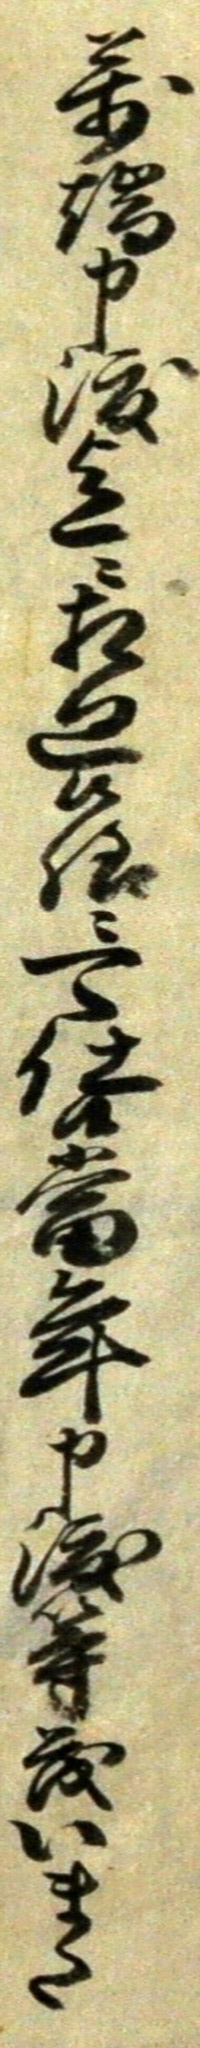万端申渡迄ニ相廻候様ニ可仕候当年申渡等茂いまた
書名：留書
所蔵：伊那市立高遠町図書館・合同会社AMANE
